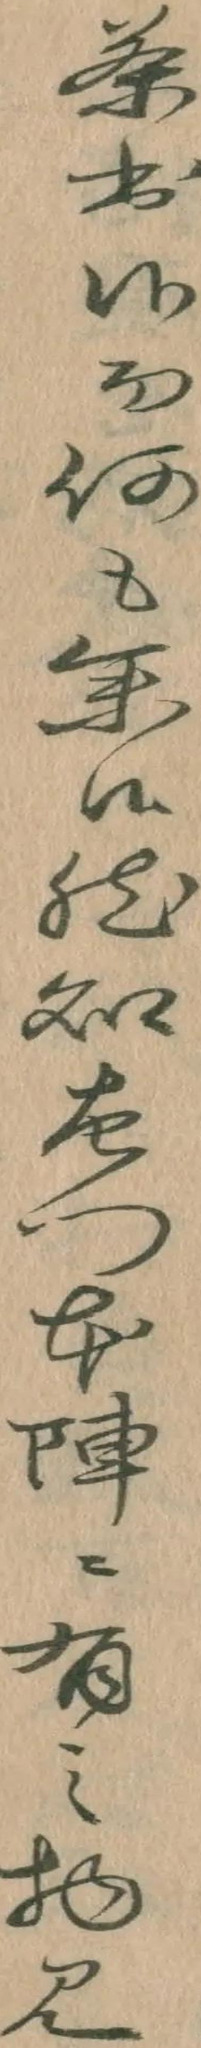茶出候而何も参候然処左門本陣に有之物見
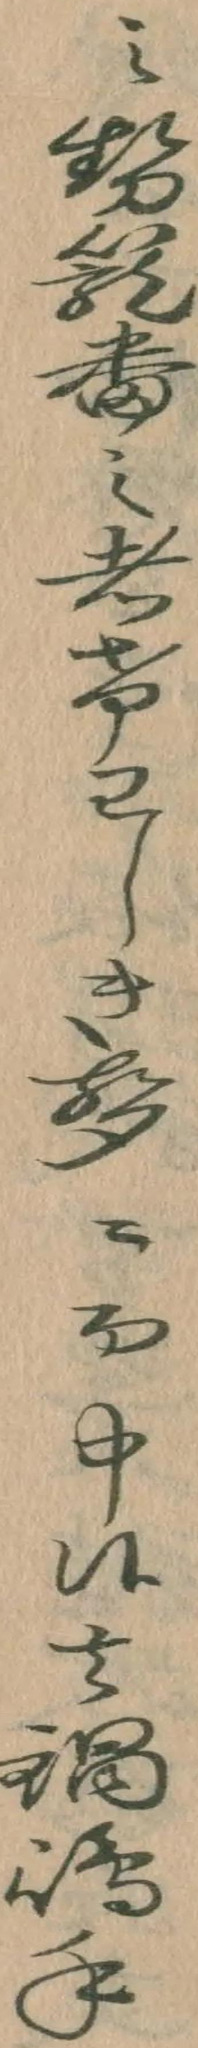之勢籠番之者希巳しき声に而申候者鍋島手
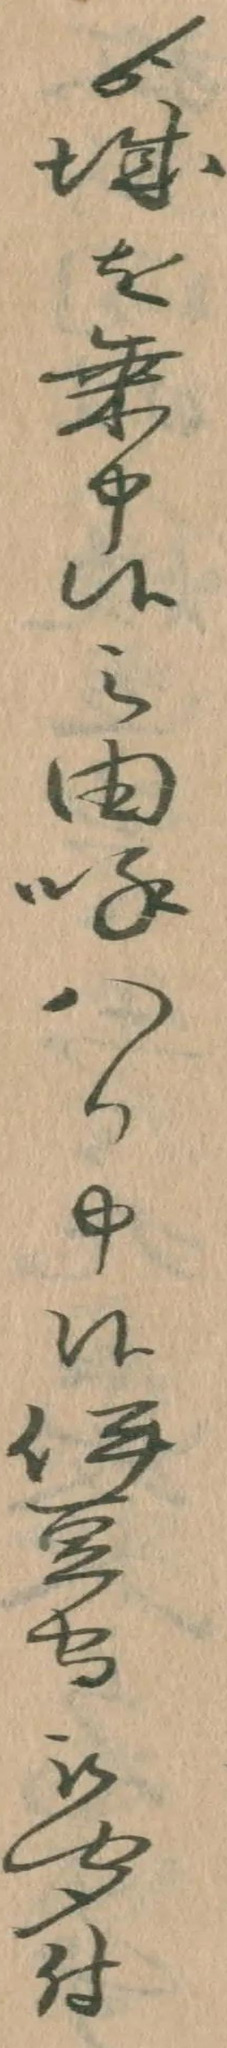ゟ城を乗申候之由呼はり申候伊豆守被聞付
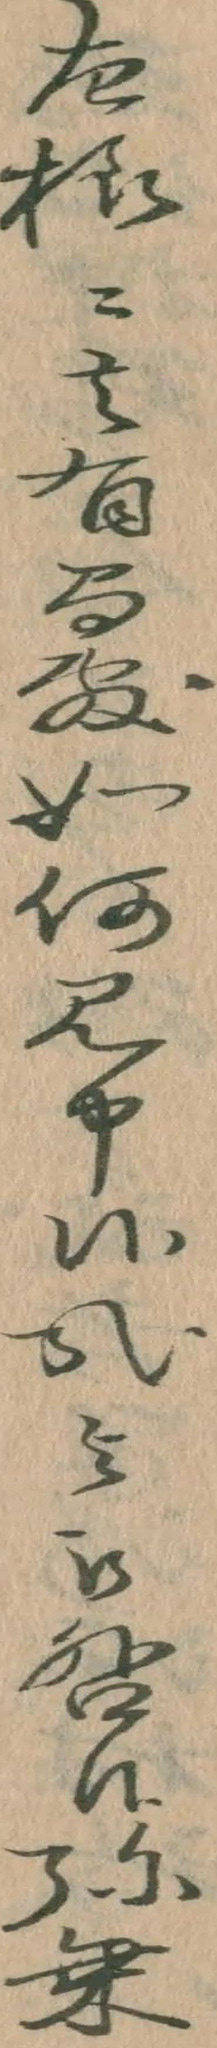左様に者有間敷如何見申候哉与被咎候弥乗
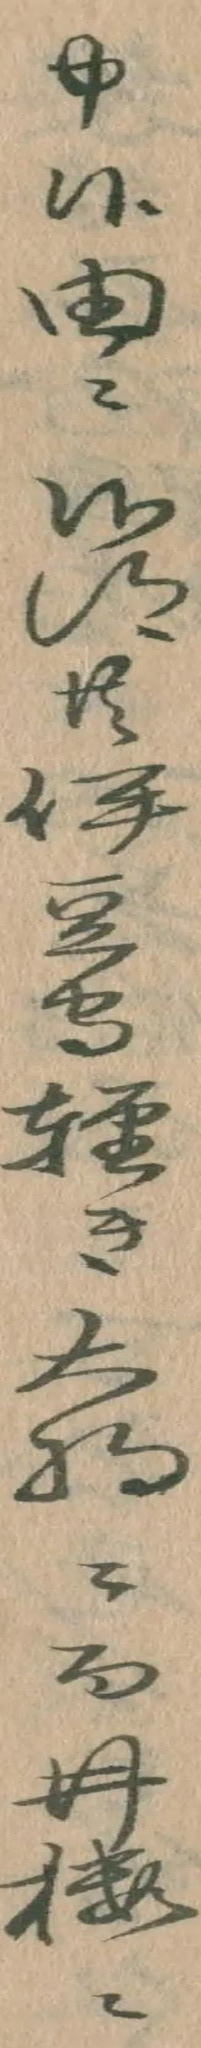申候由に候得共伊豆守軽き大将に而井樓に
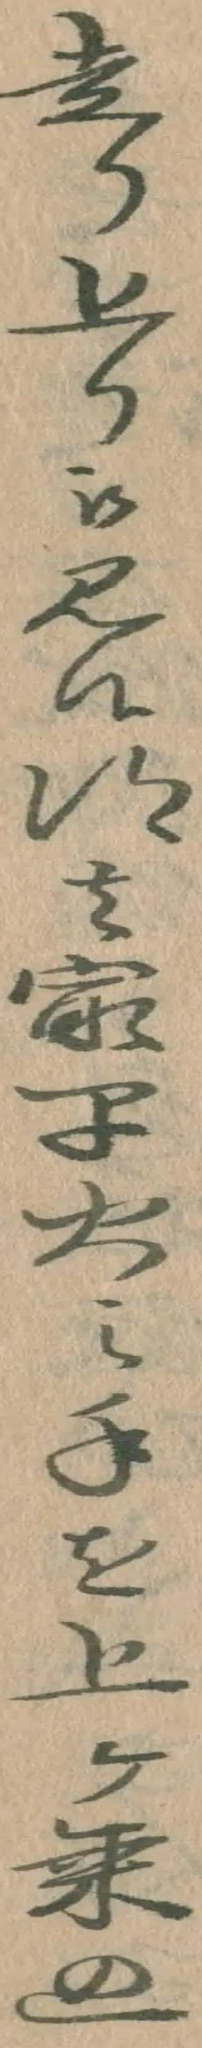走り上り被見候得者最早火之手を上け乗込
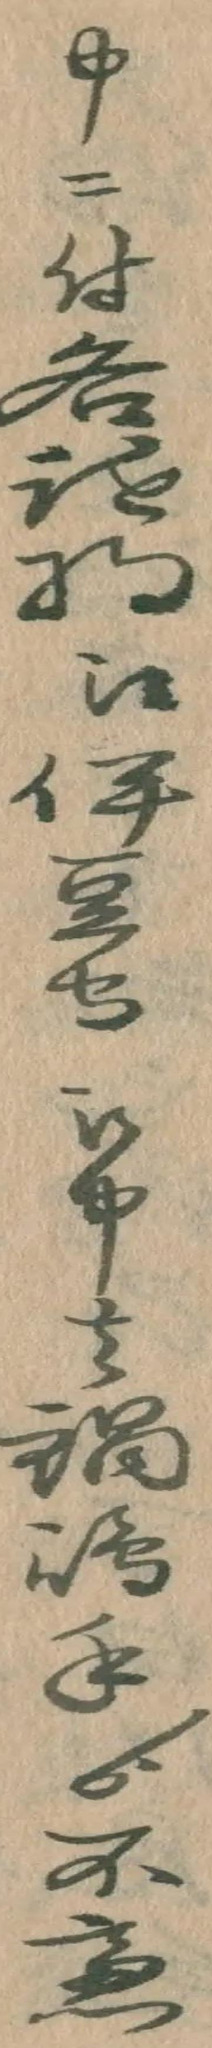申に付各諸将江伊豆守被申者鍋島手ゟ不意
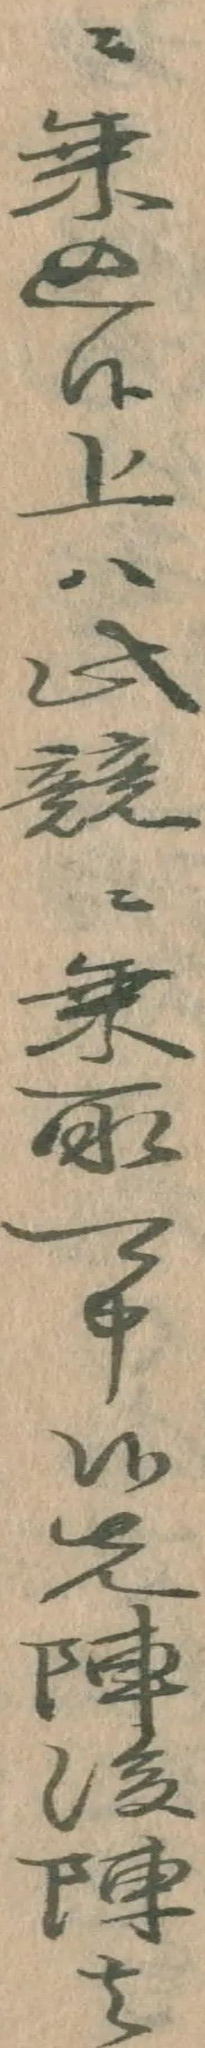に乗込候上は此競に乗取可申候先陣後陣者
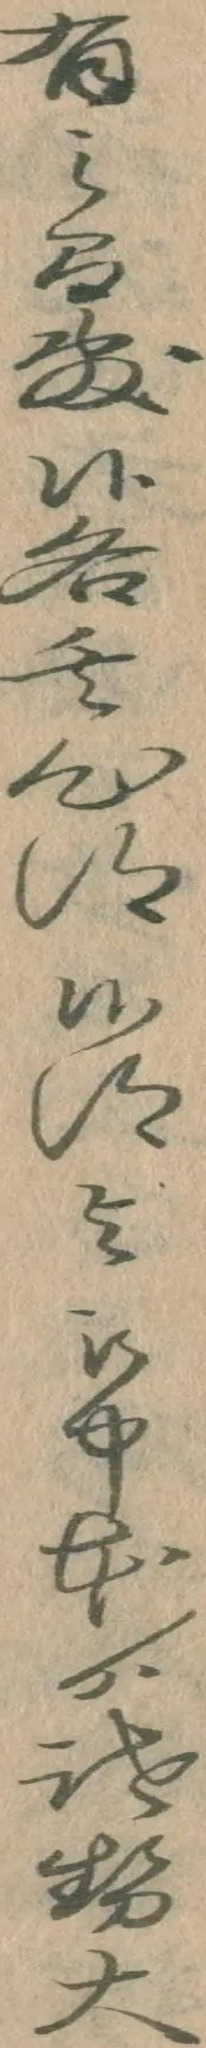有之間敷候各其心得候得与被申本ゟ諸勢大
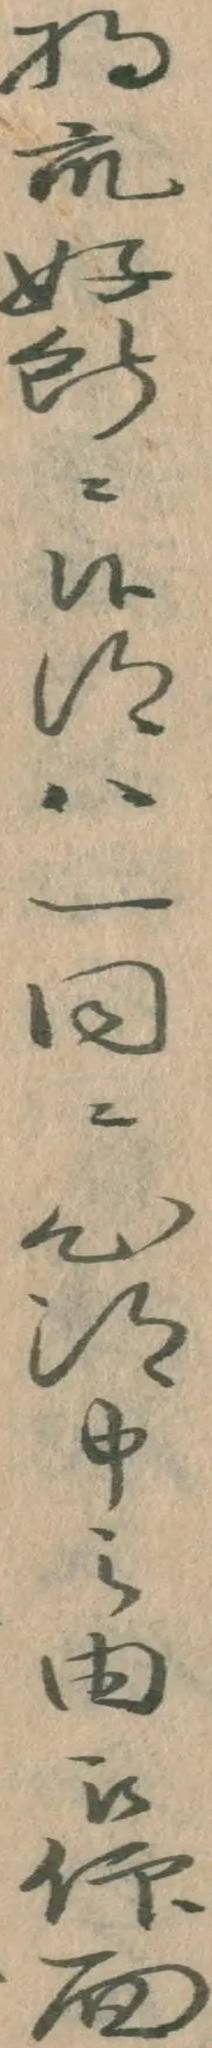将衆好所に候得は一同に心得申之由被仰面
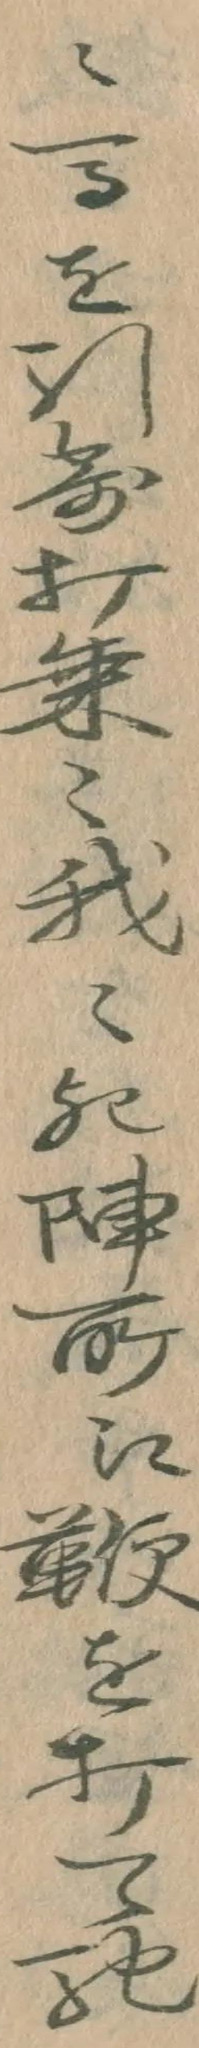々馬を引寄打乗々我々歟陣所江鞭を打可馳
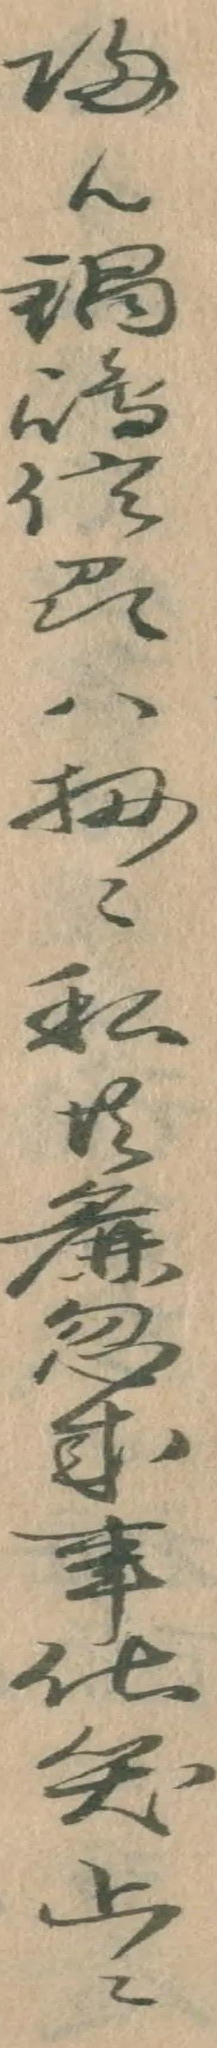帰る鍋島信州は扨々私共廉忽成事仕笑止に
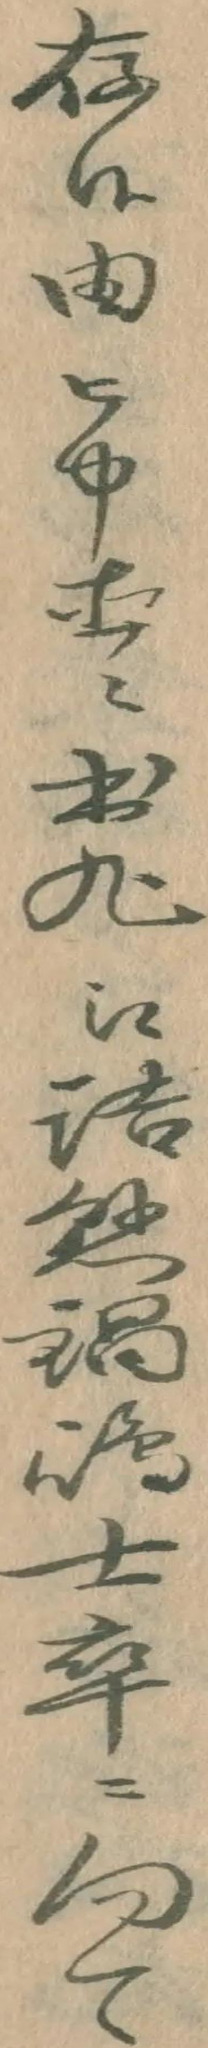存候由被申直に出丸江詰懸鍋島士卒に向て

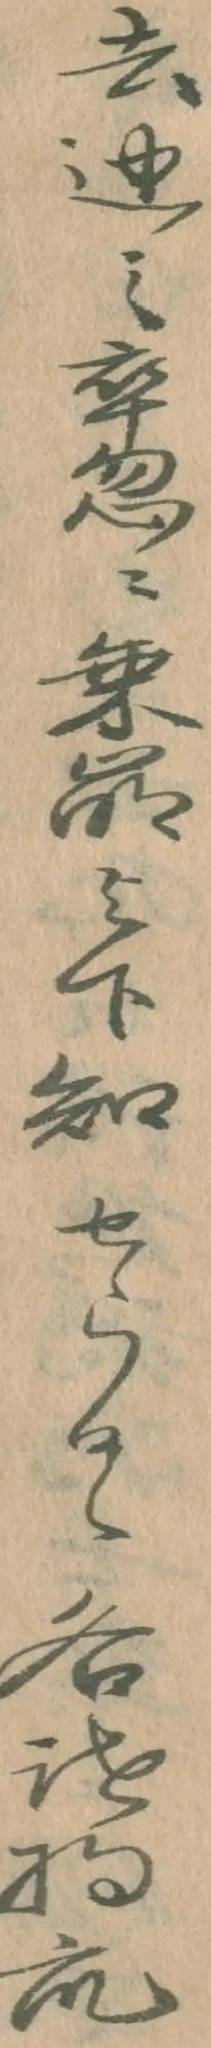去迚之卒忽に乗崩与下知せらるゝ各諸将衆
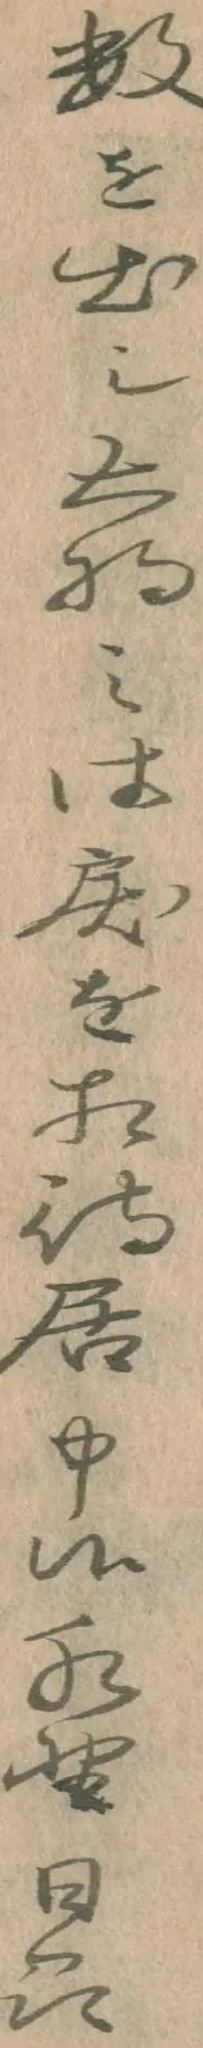数を出し大将之御戻を相待居申候水野日州
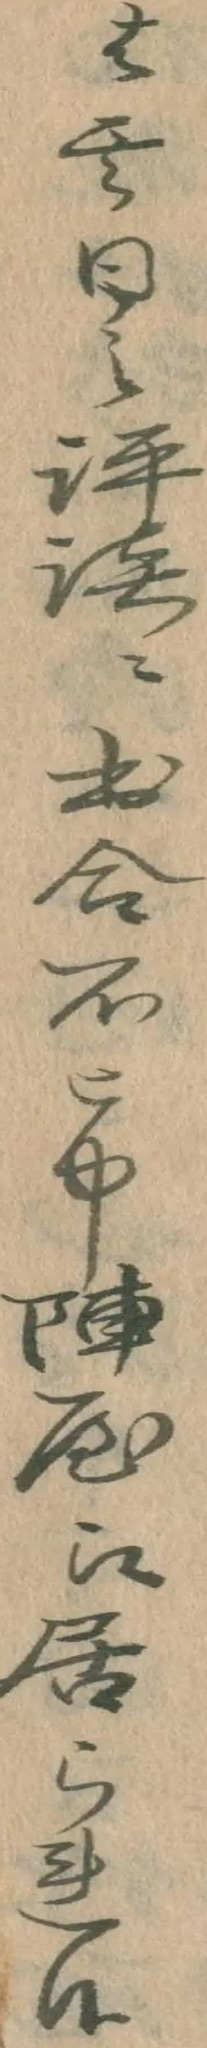者其日之評談に出合不被申陣屋江居ら連候
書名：切支丹御退治記 49巻. [7]
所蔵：国立国会図書館 National Diet Library, JAPAN
